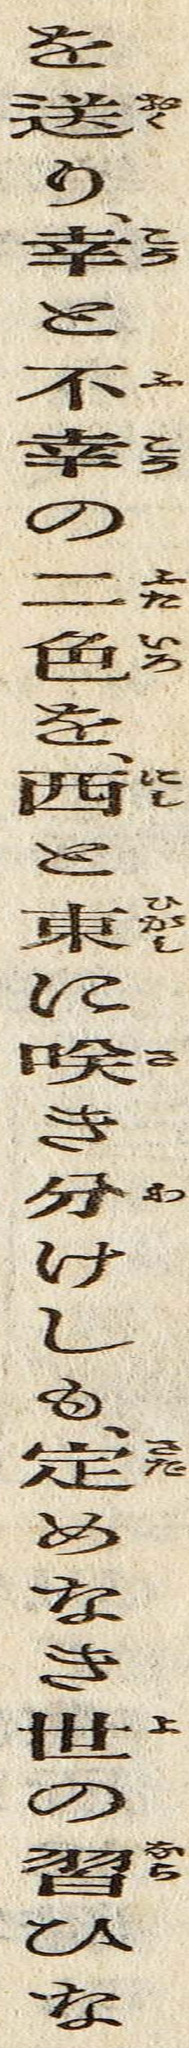を送り、幸と不幸の二色を、西と東に咲き分けしも、定めなき世の習ひな
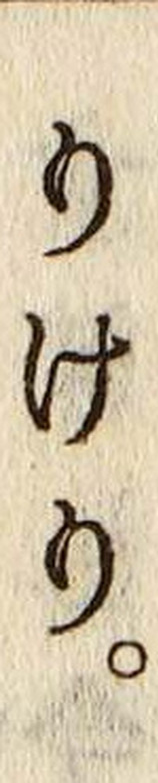りけり。
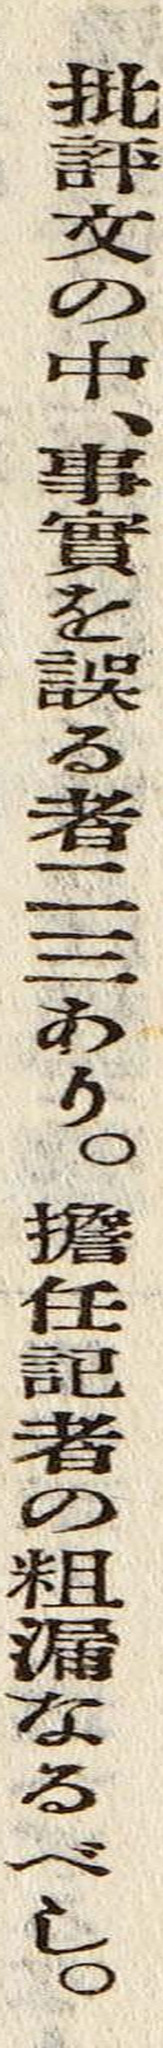批評文の中、事実を誤る者二三あり。擔任記者粗漏なるべし。
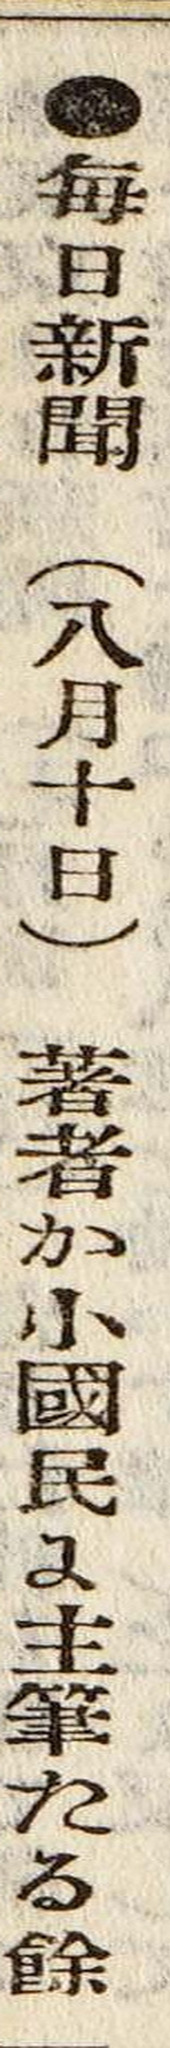●毎日新聞(八月十日)著者か小国民に主筆たる余
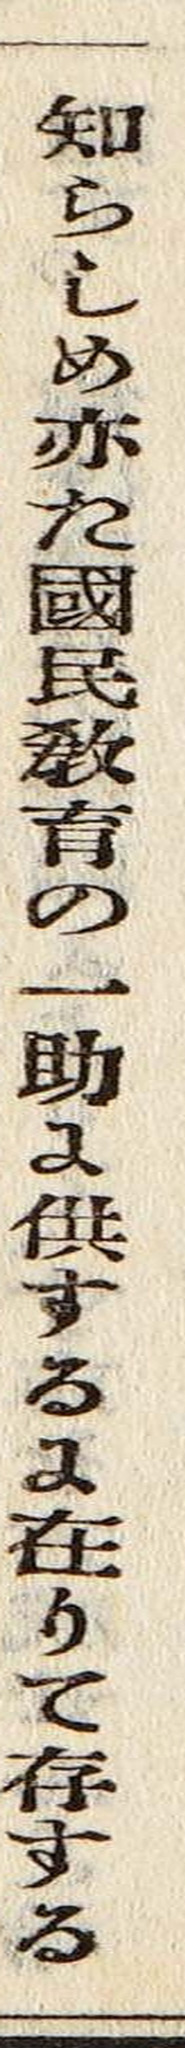知らしめ亦国民教育の一助に供するに在りて存する
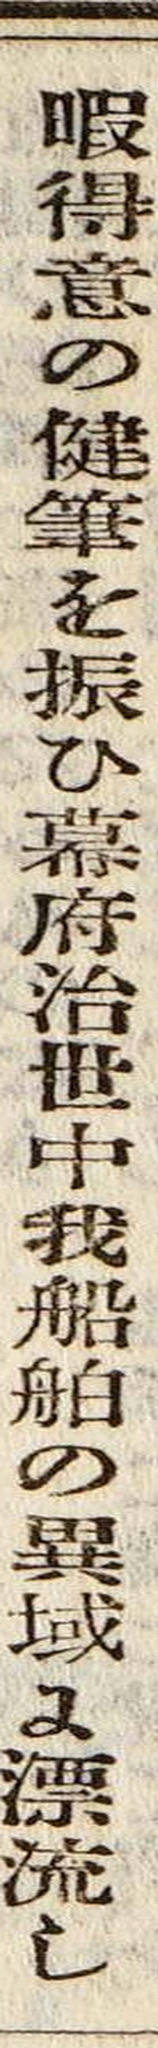暇得意の健筆健筆を振ひ幕府治世中我船舶の異域に漂流し
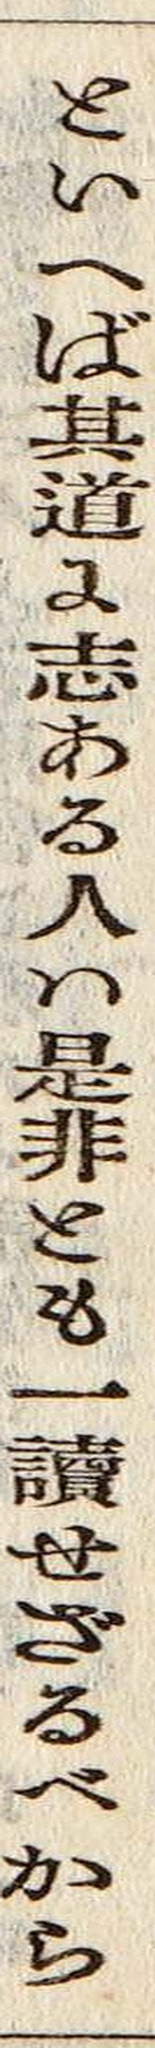といへば其道に志ある人は是非とも一読せざるべから
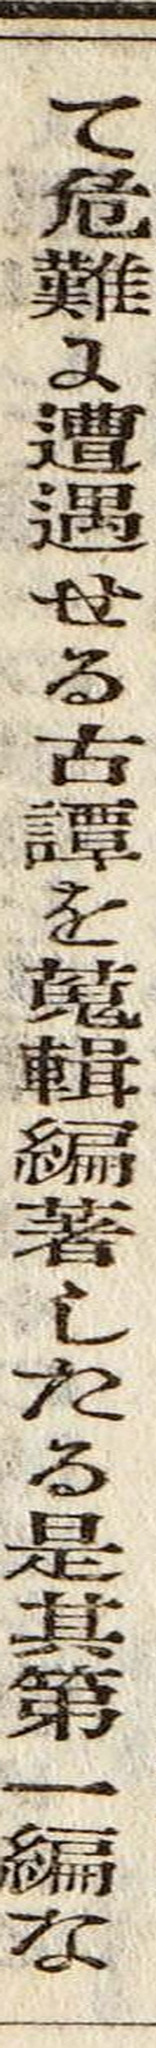て危難に遭遇せる古潭を蒐輯編著したる是其第一編な
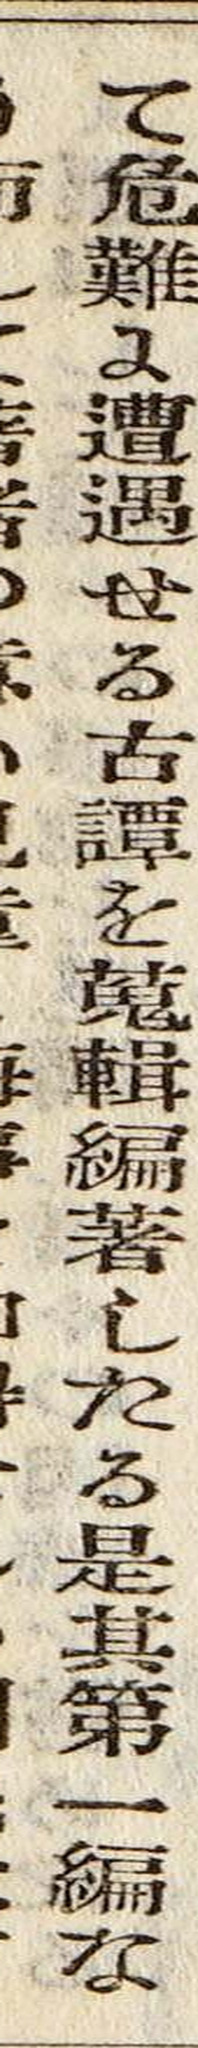て危難に遭遇せる古潭を蒐輯編著したる是其第一編な
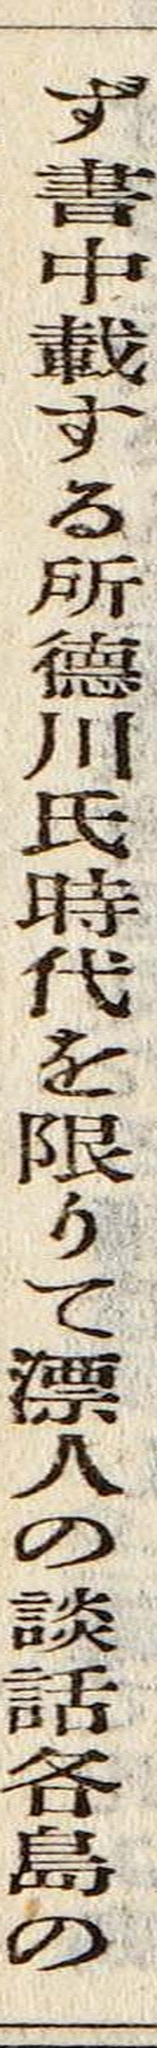ず書中載する所徳川氏時代を限りて漂人の談話各島の
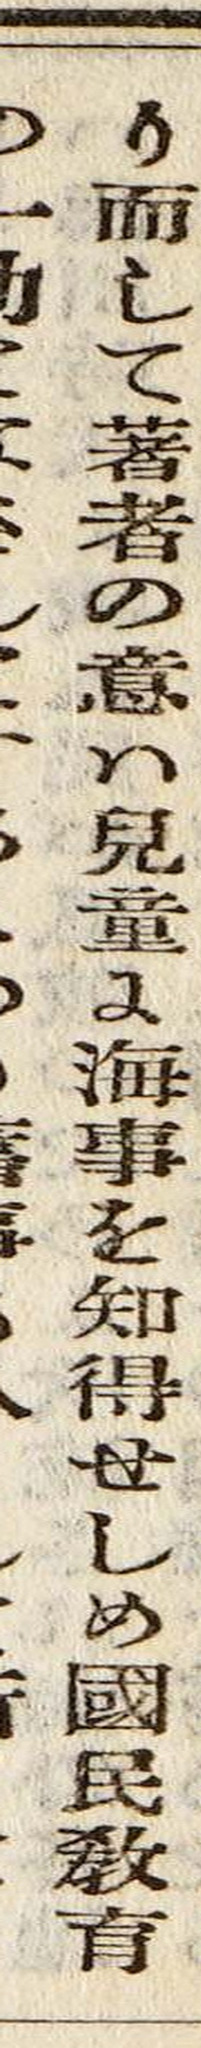り而して著者の意は児童に海事を知得せしめ国民教育
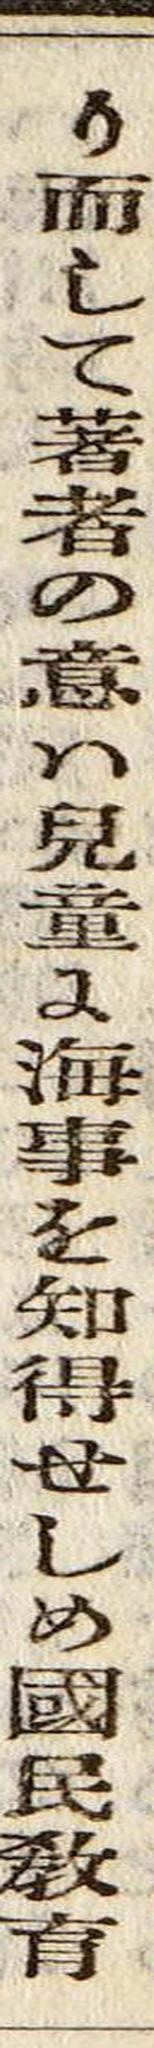り而して著者の意は児童に海事を知得せしめ国民教育
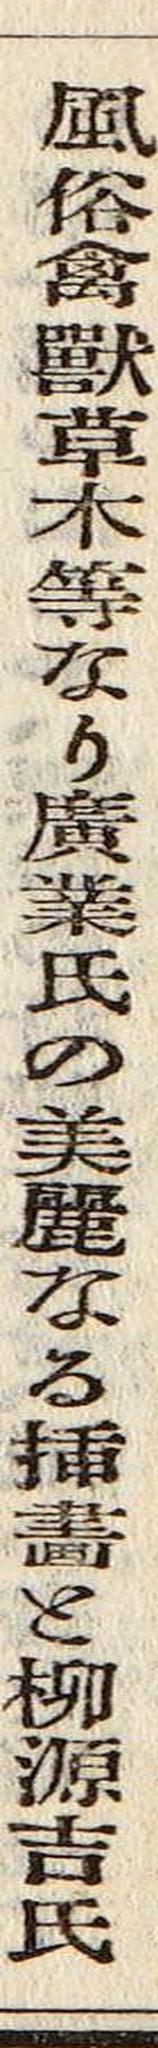風俗禽獣草木等なり広業氏の美麗なる挿画と柳源吉氏
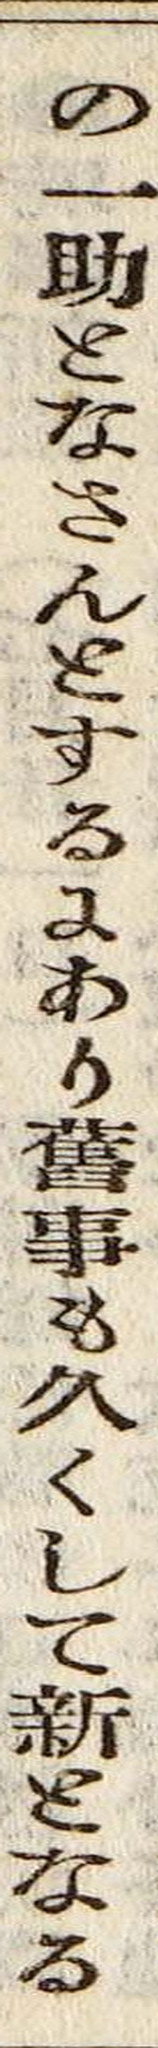の一助となさんとするにあり旧事も久しくして新となる
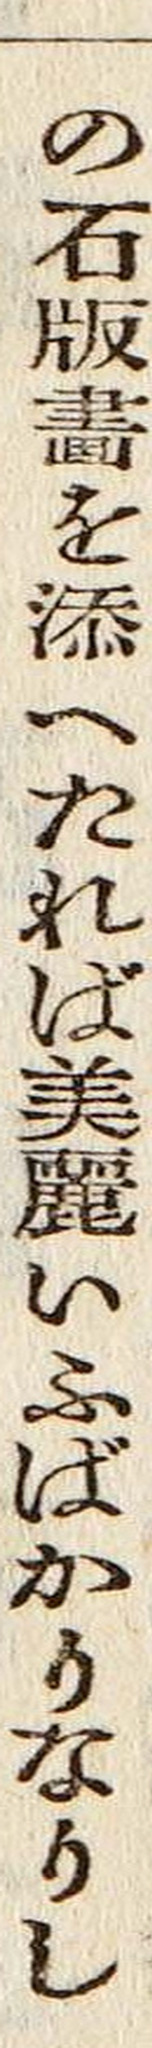の石版画を添へたれば美麗いふばかりなりし
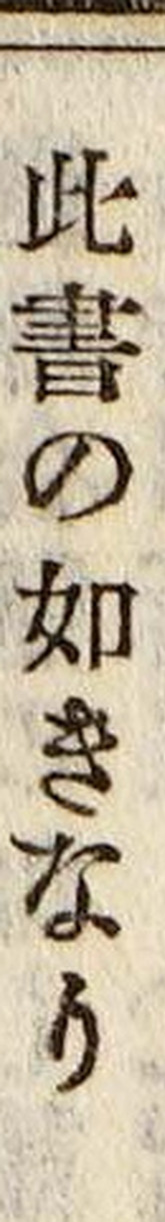此書の如きなり
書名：日本漂流譚
